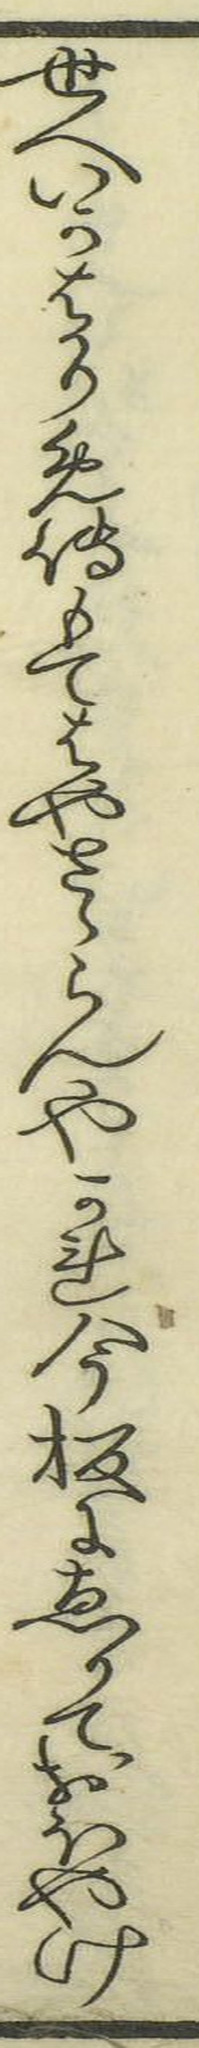世人いかはかりめてもてはやさゝらんやかれ今板にゑりておほやけ
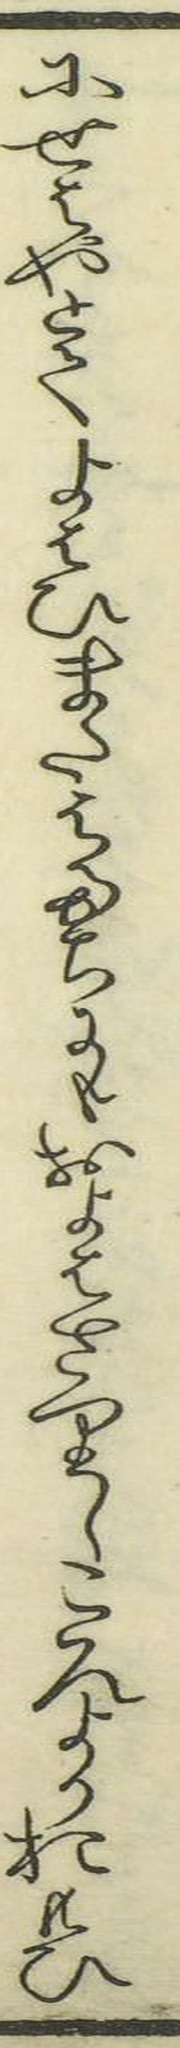にせはやとてよはひまたはたちにもおよはさりしころよりおもひ
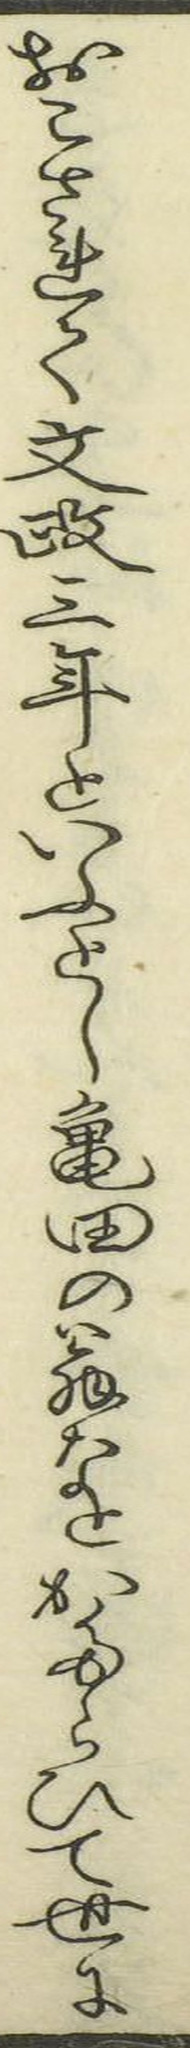おこされて文政三年といふとし亀田の翁なとかたらひて世に
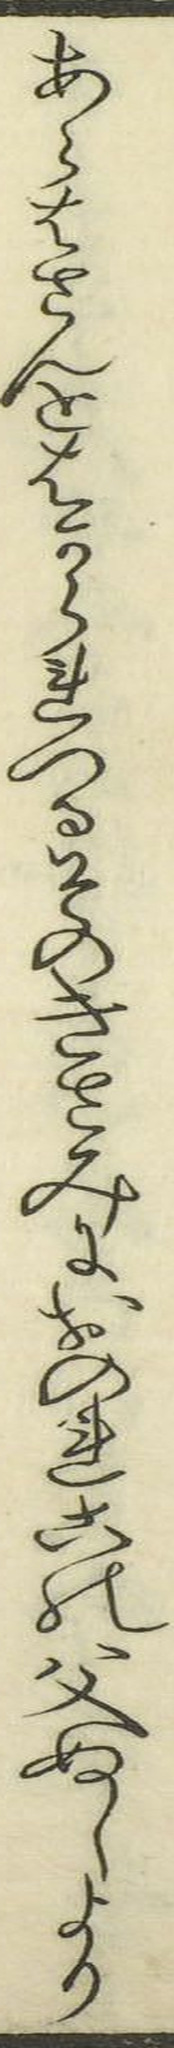あらはさんとはかられつるそのきさみにおのれこの父ぬしより
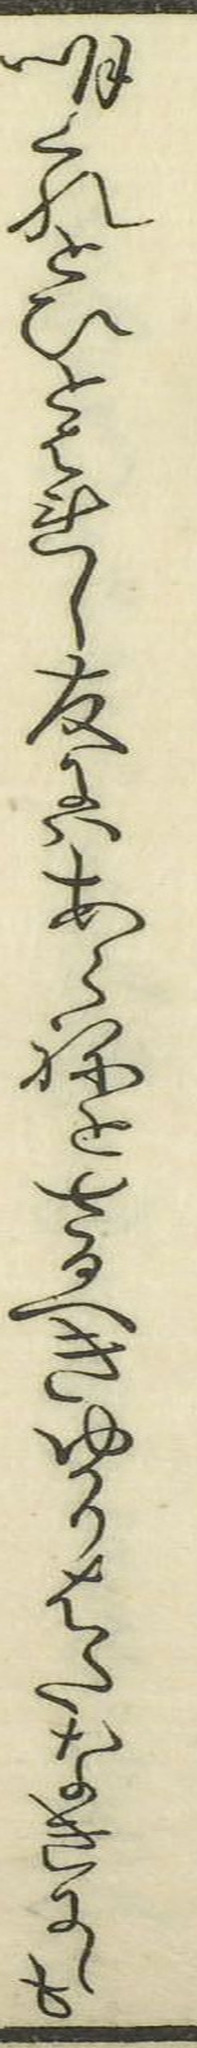明くれとひとはれし友にハあらねとさるへきゆかりはたなきにしも
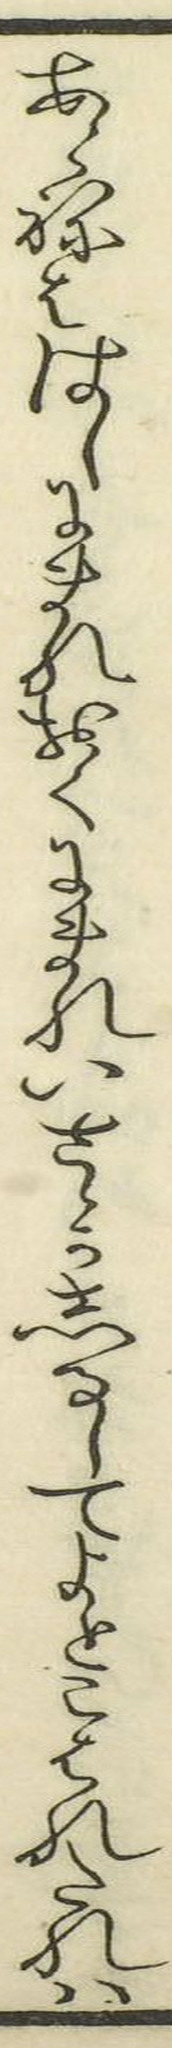あらねははしにまれおくにまれいさゝかしるしてよとこはれたれハ
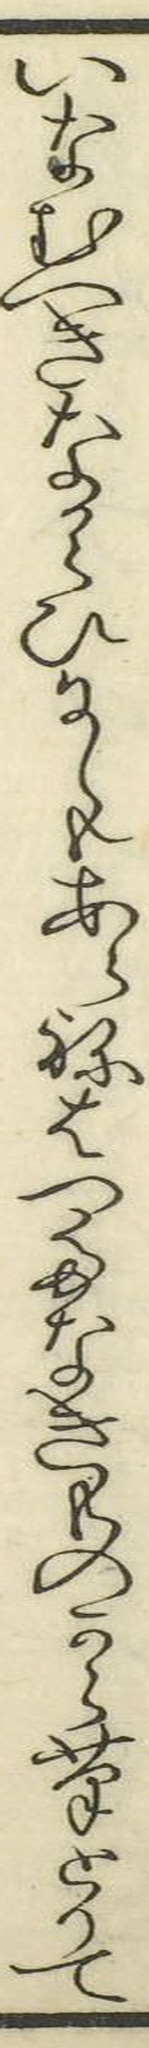いなむへきなからひにしもあらねはつたなきものから草とりて
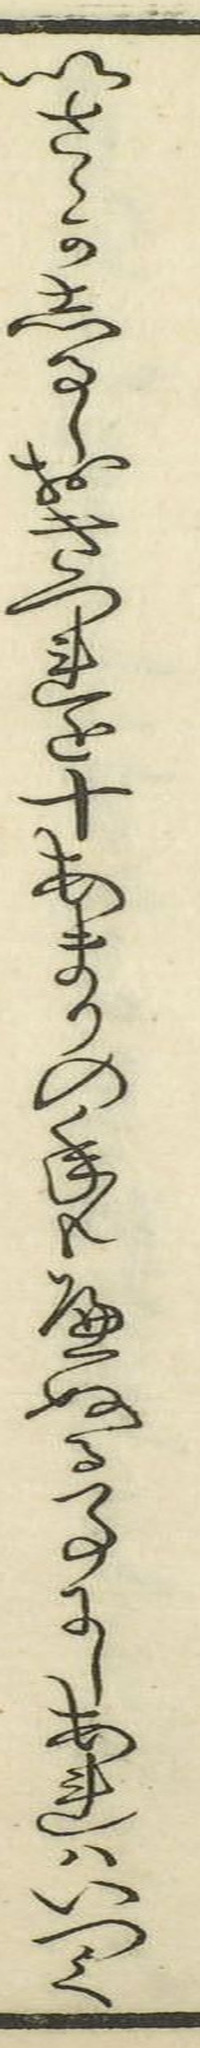いさゝかしるしおきつれと十あまりの年もへぬる事にしあれハいつく
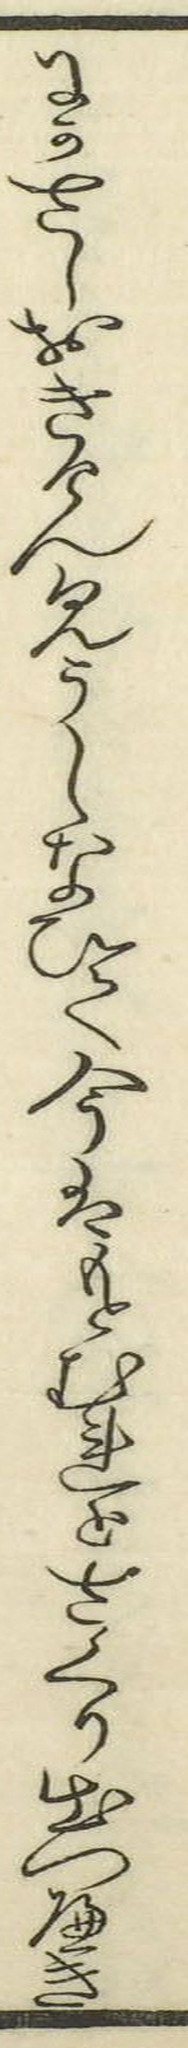にかさしおきけん見うしなひて今はもとむれとさくり出つへき
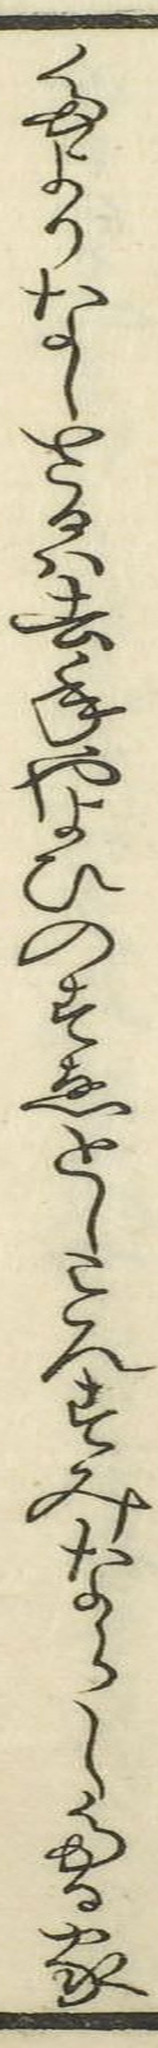たよりなしさるハ去年やよひのすゑとしころすみならしたる家
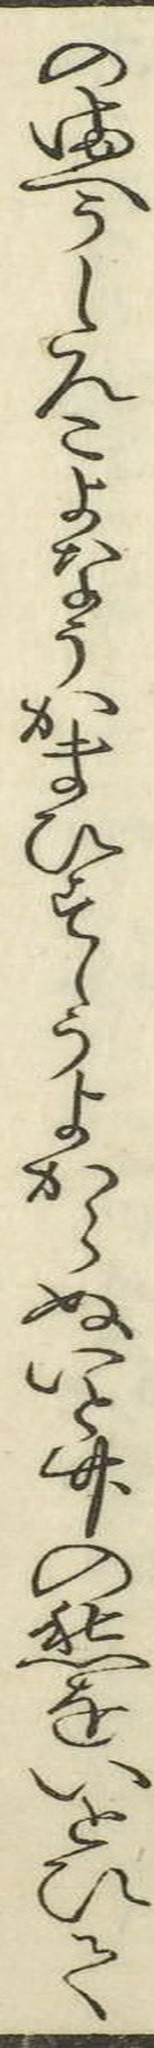のまへうしろこよなうかまひすしうよからぬいと竹の愁をいとひて
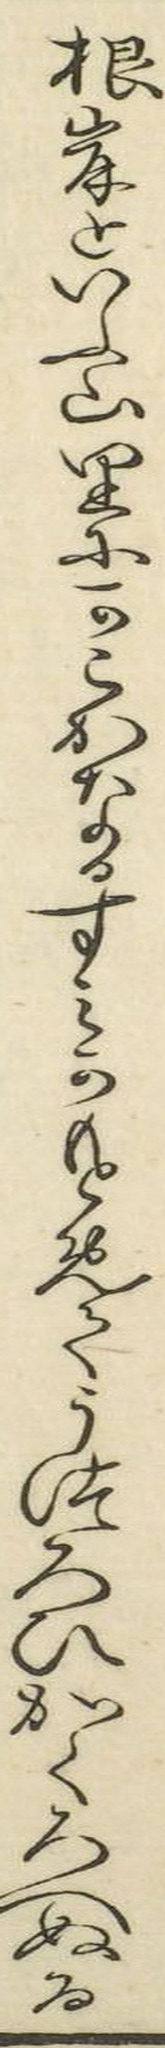根岸といふ山里にかこかなるすみかもとめてうつろひかくろへぬる
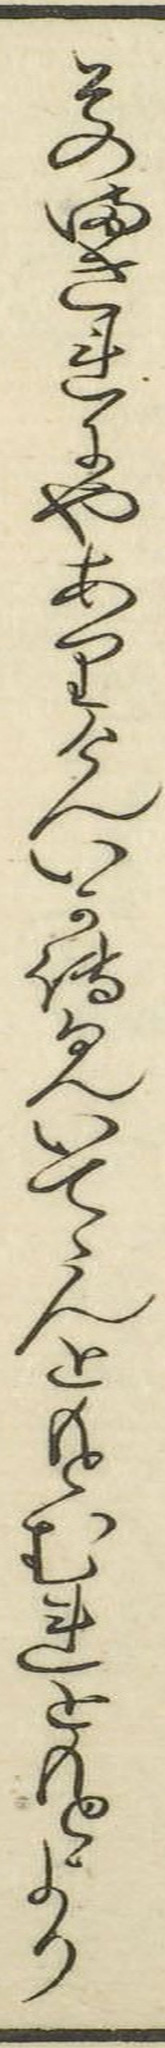そのまきれにやありけんいかて見いてゝんともとむれともとより
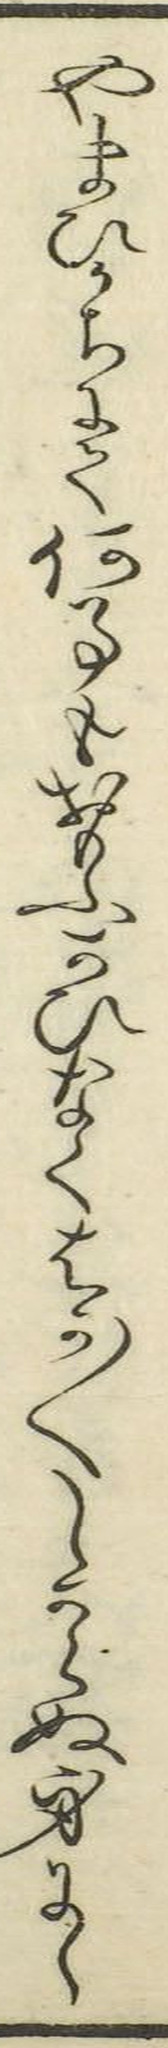やまひかちにて何事もおもふかひなくはか〳〵しからぬ身にし
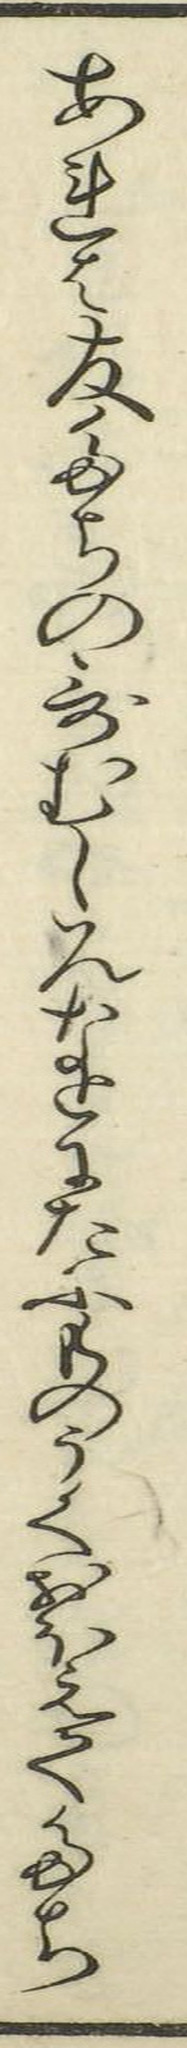あれは友たちの哥むしろなとにたにものうくおほえてたち
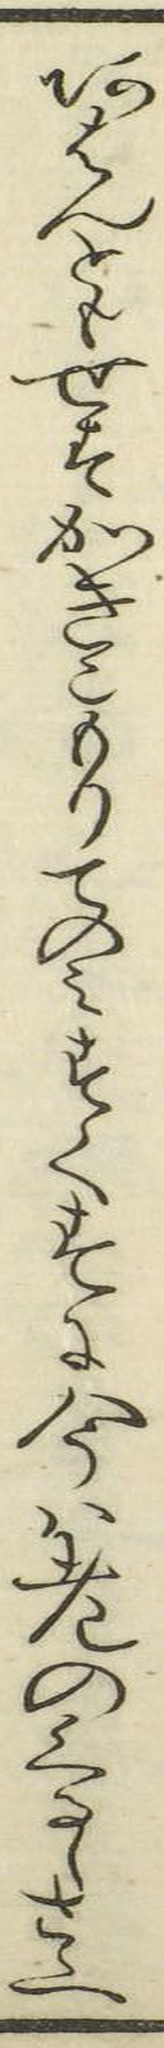あはんともせすかきこもりてのみすくすに今ハ老のくるしさゝへ
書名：江戸名所図会 20巻 巻之1
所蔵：東京学芸大学教育コンテンツアーカイブ
